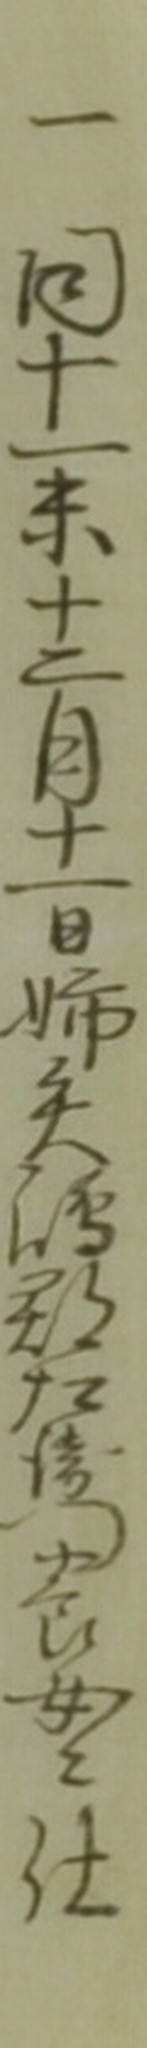一同十一未十二月十一日姉矢嶋郡左衛門養女ニ仕
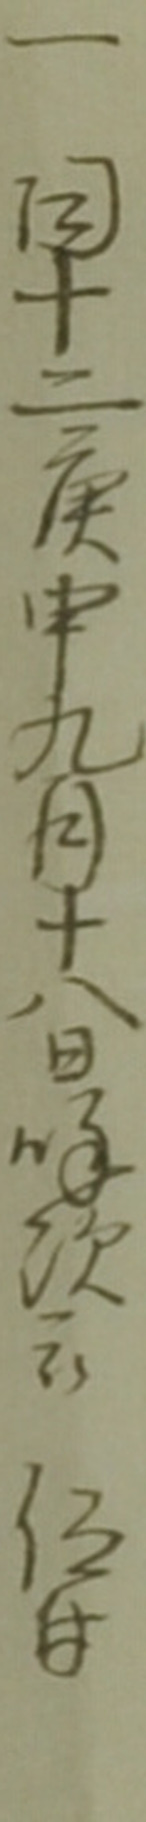一同十二庚申九月十八日呼次被仰付
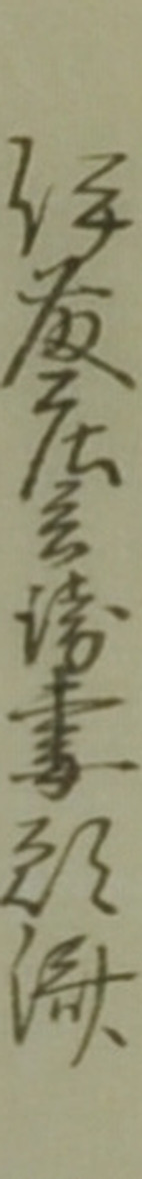伊藤庄兵衛妻願済
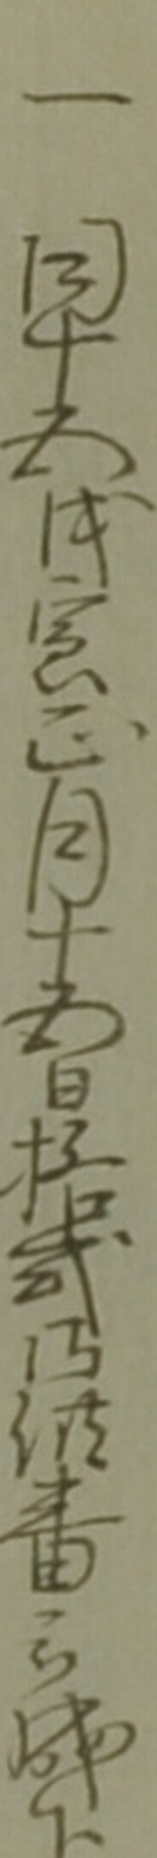一同十五戌寅正月十五日格式御供番被成下勤方
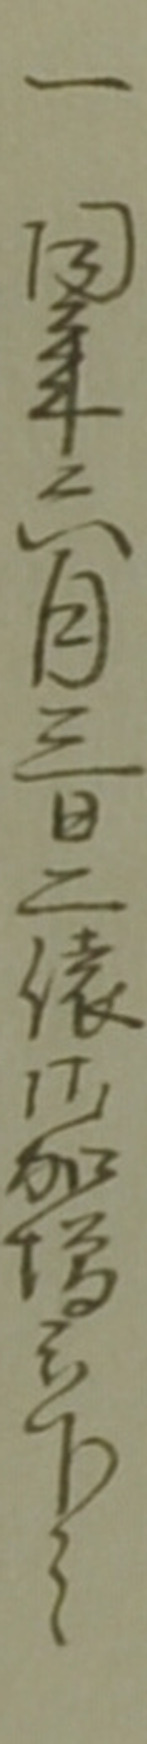一同年六月三日二俵御加増被下之
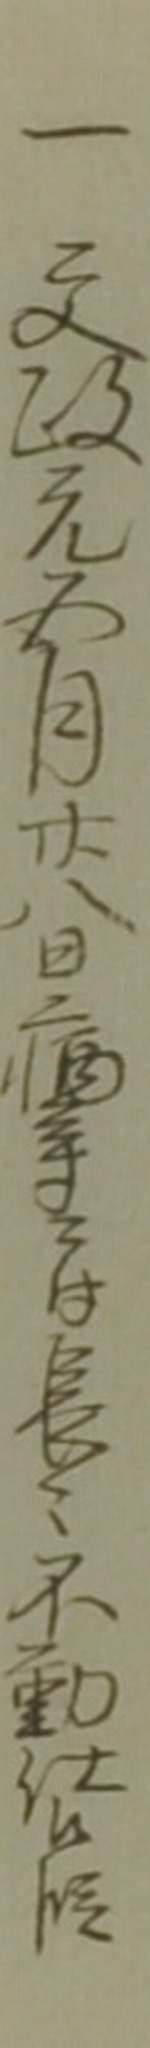一文政元五月廿八日病気ニ付長々不勤仕候段
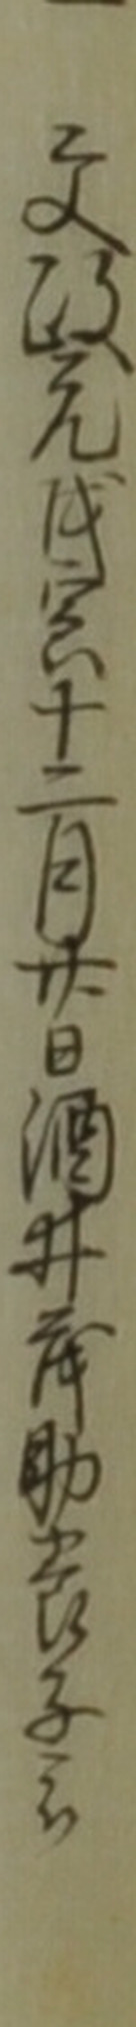一文政元戌寅十二月廿日酒井茂助養子被
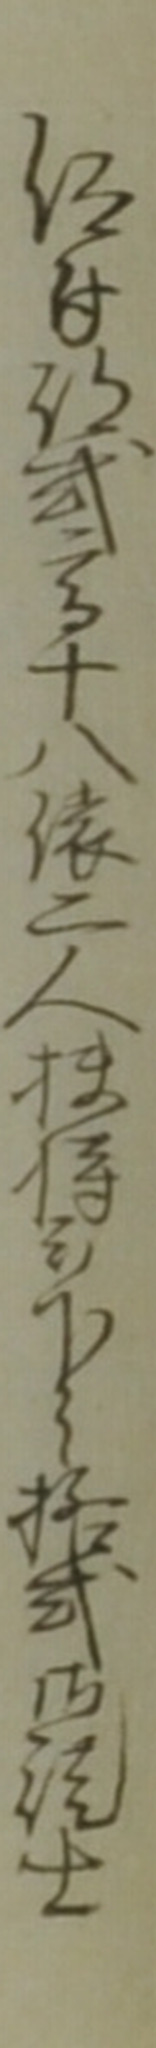仰付跡式高十八俵二人扶持被下之格式御徒士

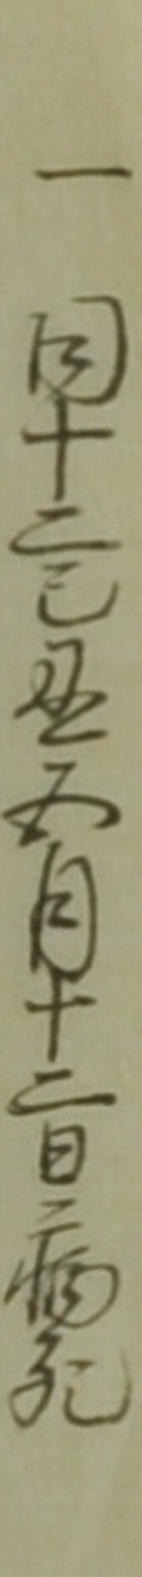一同十二己丑五月十二日病死
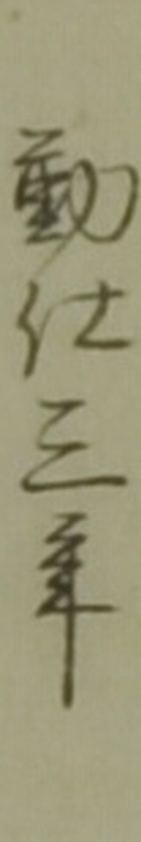勤仕三年
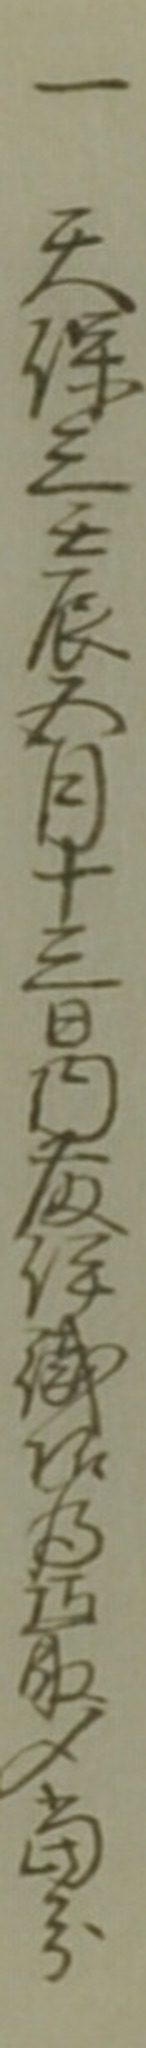一天保三壬辰五月十三日内藤伊織様為御取〆当分
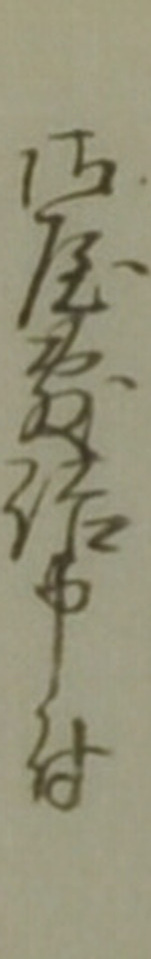御屋敷詰申付
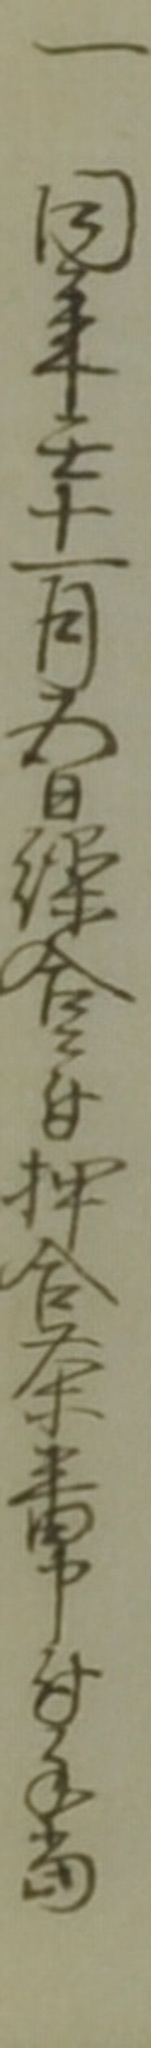一同年閏十一月五日繰合ニ付押合茶番申付手当
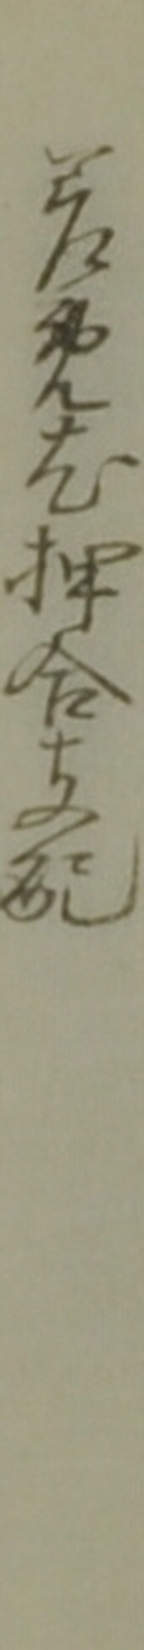差免尤押合支配
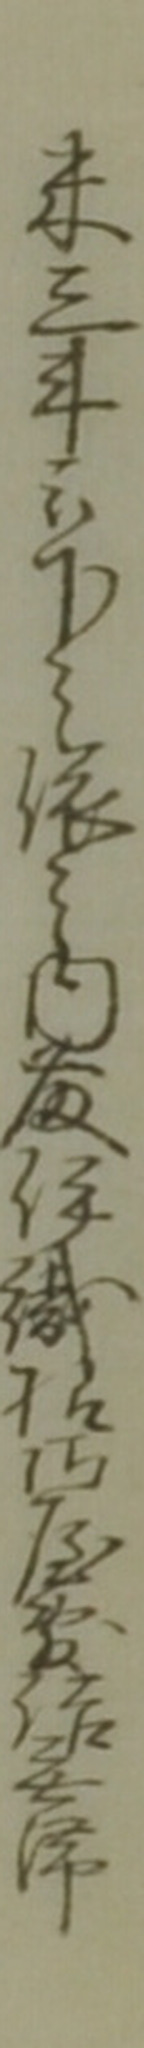米三斗被下之依之内藤伊織様御屋敷詰無滞
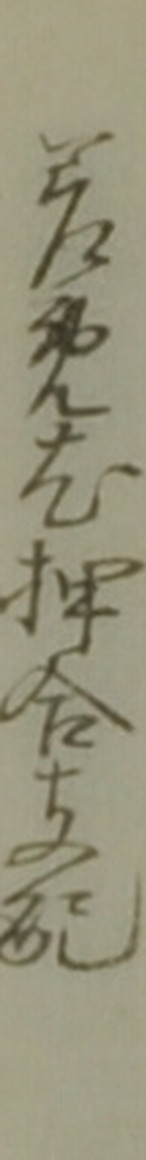差免尤押合支配
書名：無足諸士勤仕録（九）
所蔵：伊那市立高遠町図書館・合同会社AMANE
